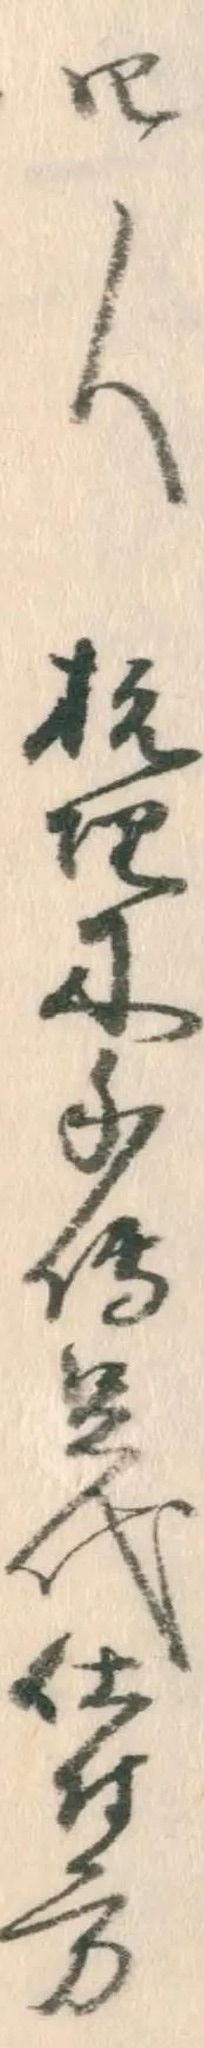四人杭埋木手伝足代仕付方
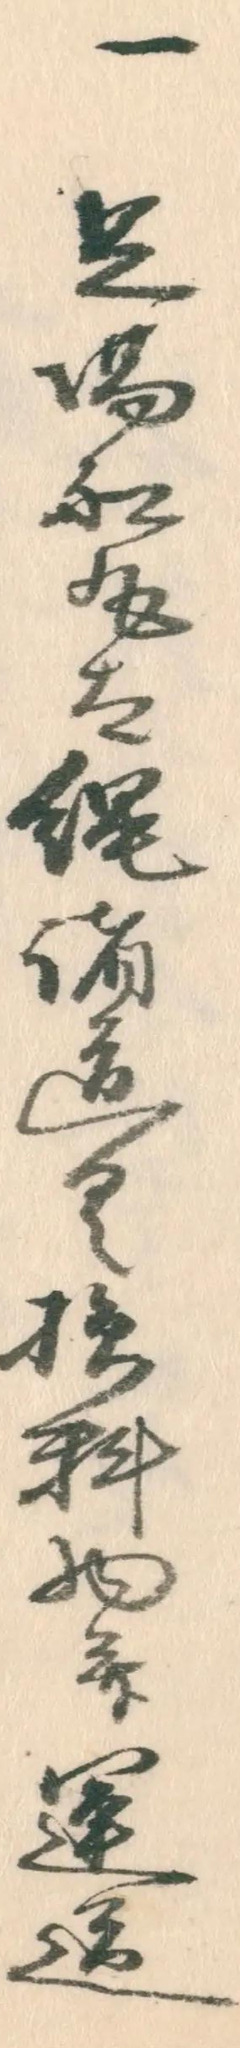一足場船丸太縄諸道具損料物并運送
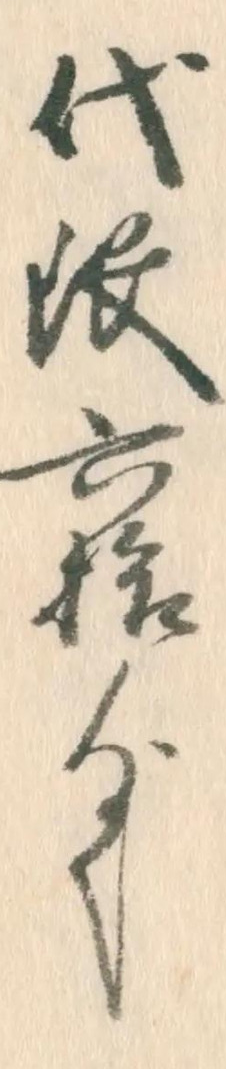代銀六拾匁

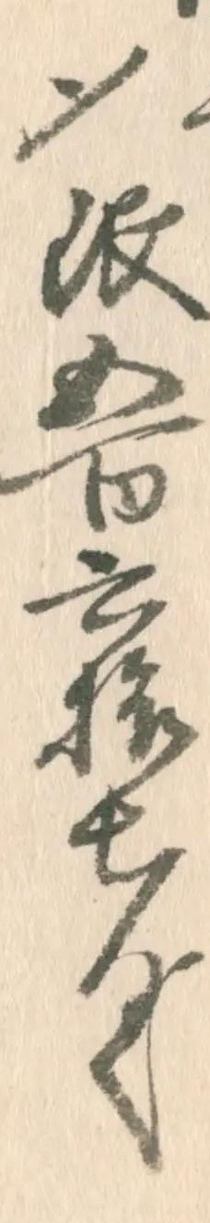〆銀五百六拾七匁
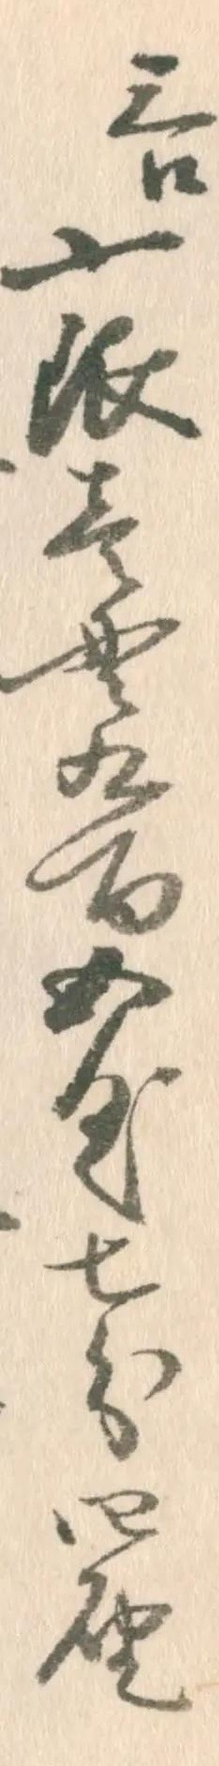〆銀壱貫九百五匁七分四厘
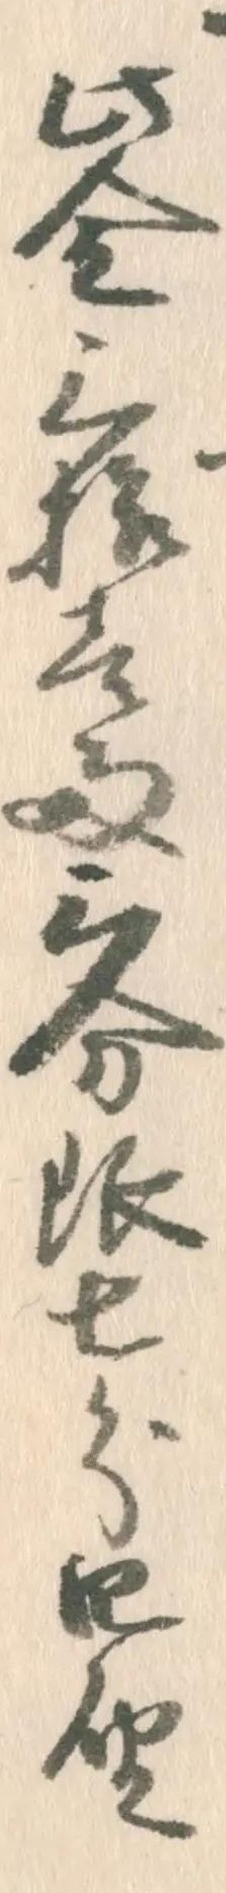此金三拾壱両三分銀七分四厘
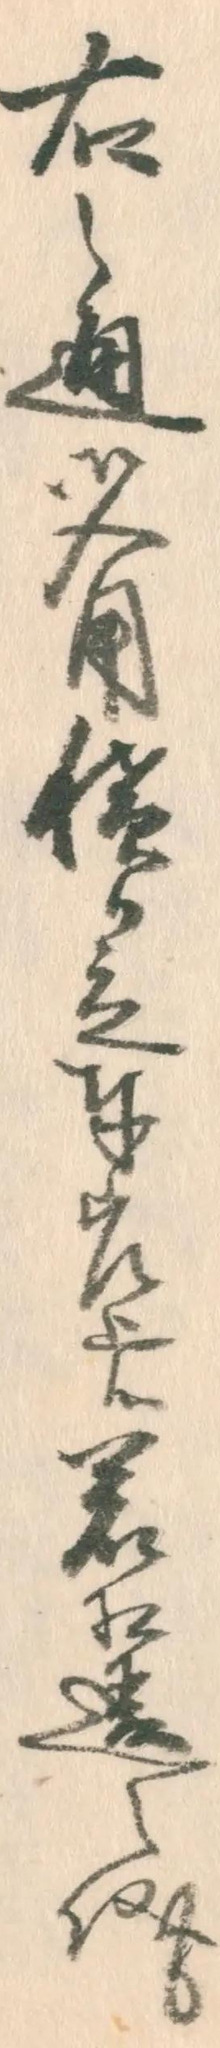右之通御入用積り立奉差上候若相違之儀も
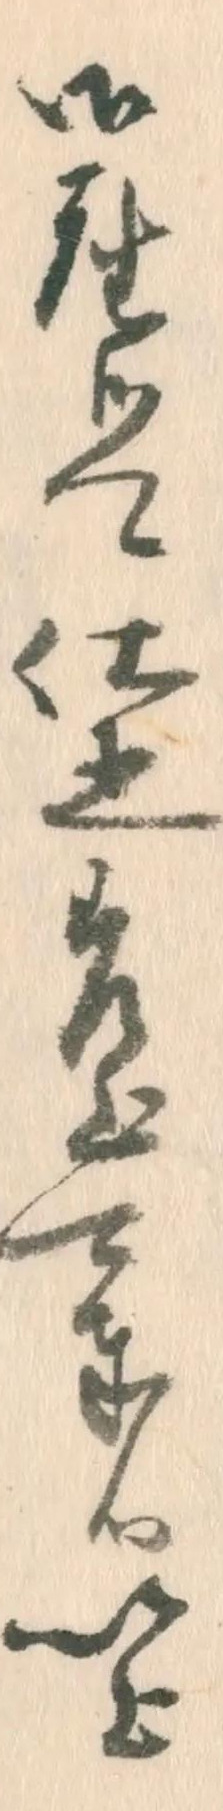御座候ハヽ仕直差上可奉候以上
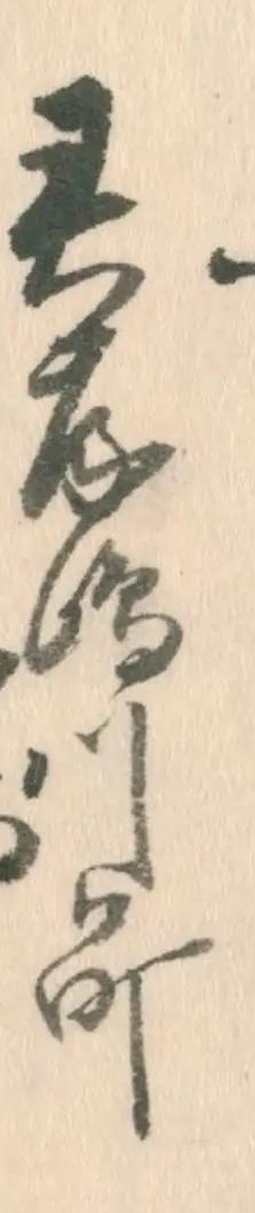霊岸島川口町
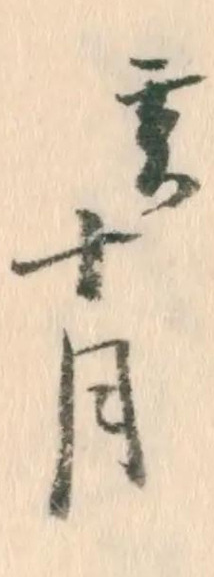亥十月
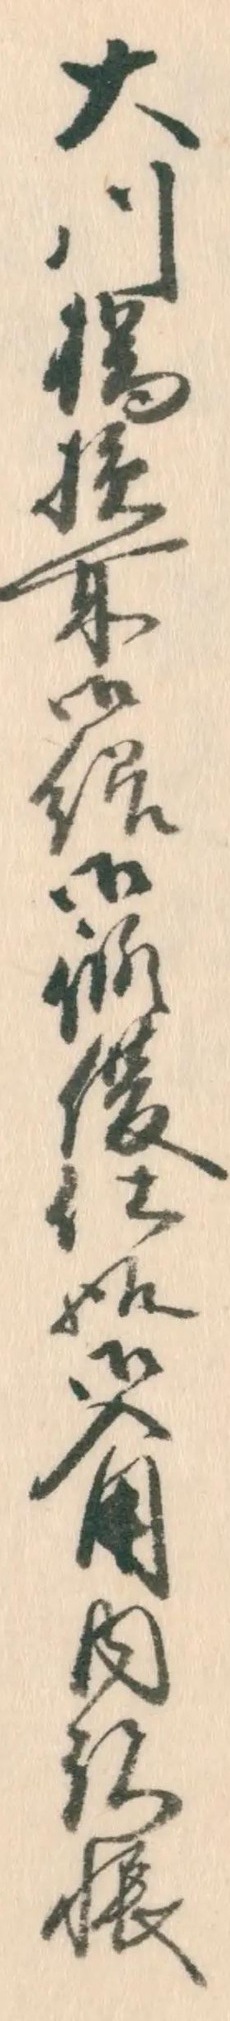大川橋損所御繕御修復仕様御入用内訳帳

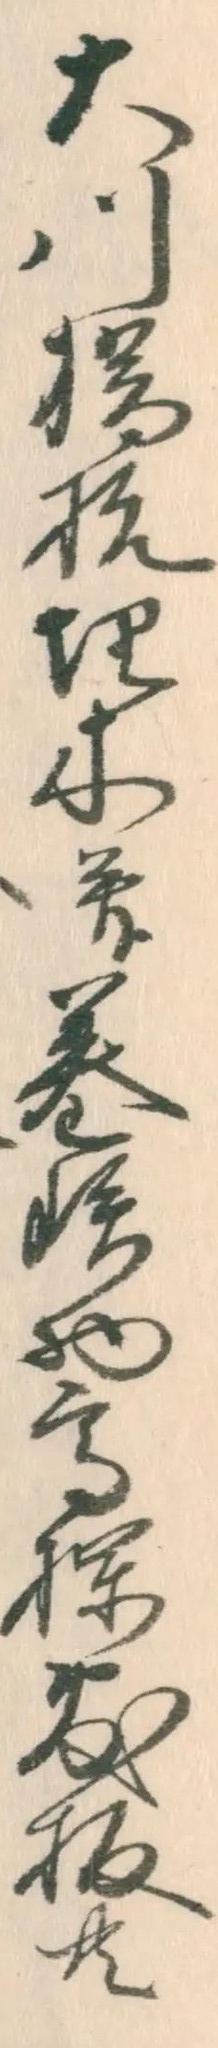大川橋杭埋木并巻鉄物高欄敷板共
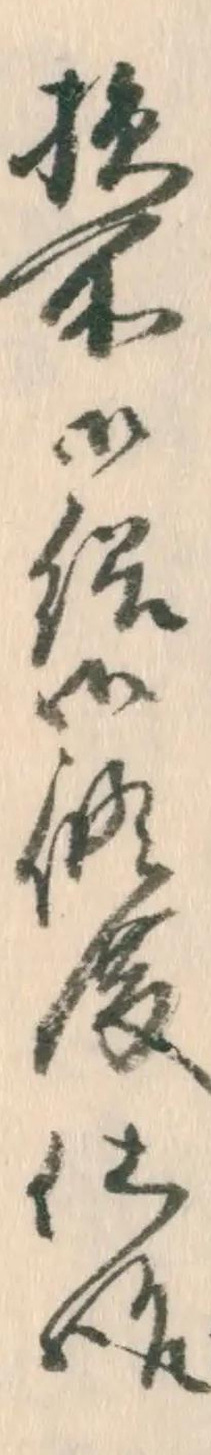損所御繕御修復仕様
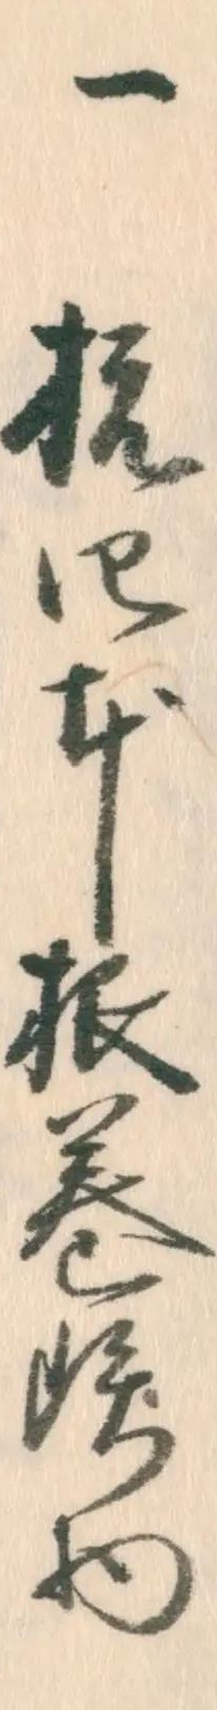一杭四本根巻鉄物
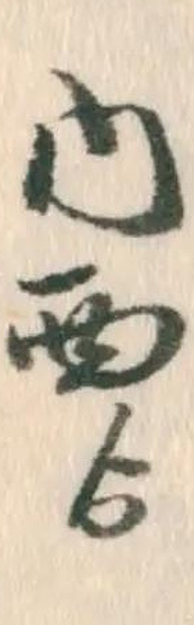内西ゟ
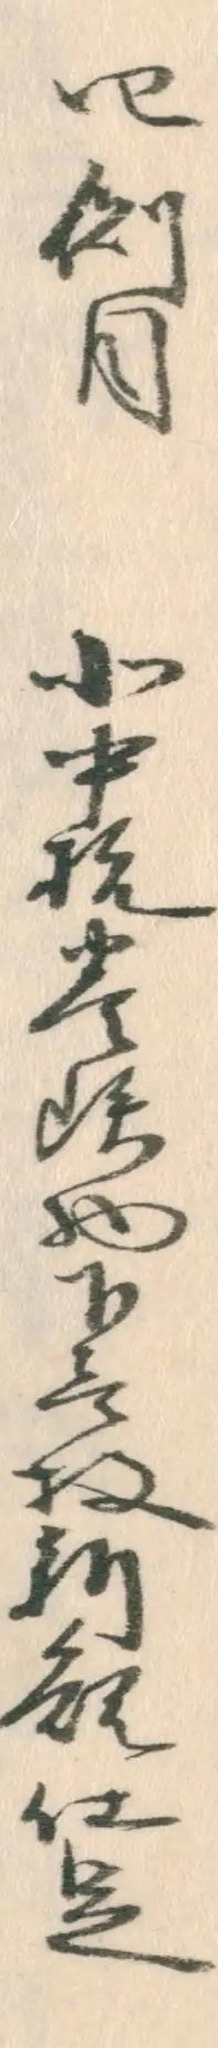四側目北中杭巻鉄物下壱枚新規仕足
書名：三橋 17巻. [7] 三橋小破御修復書留　但御奉行御掛リ替地震潰橋番屋　嘉永四亥年より安政二卯年迄　上
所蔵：国立国会図書館 National Diet Library, JAPAN
